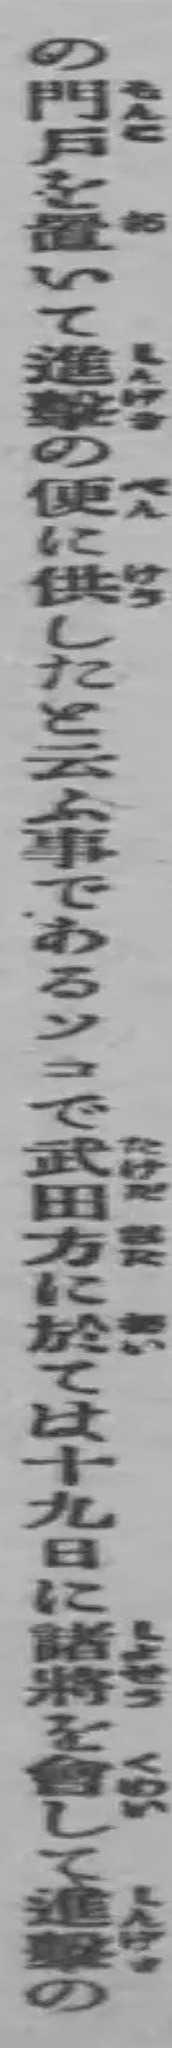の門戸を置いて進撃便に供したと云ふ事であるソコで武田方に於ては十九日に諸将を会して進撃の
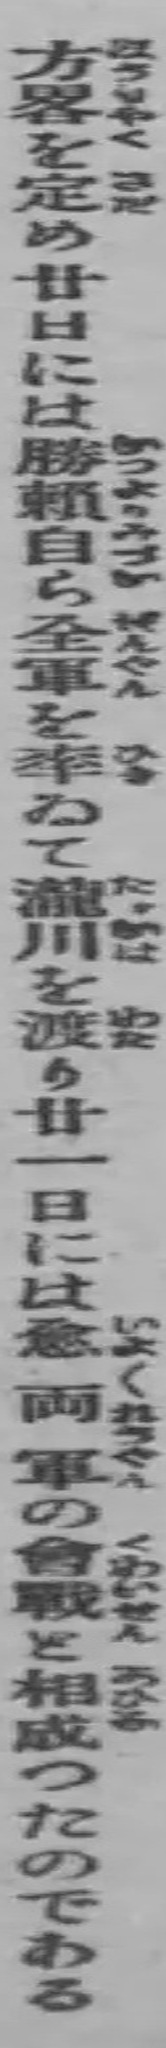方略を定め廿日には勝頼自ら全軍を率ゐて瀧川を渡り廿一日には愈両軍の会戦と相成つたのである
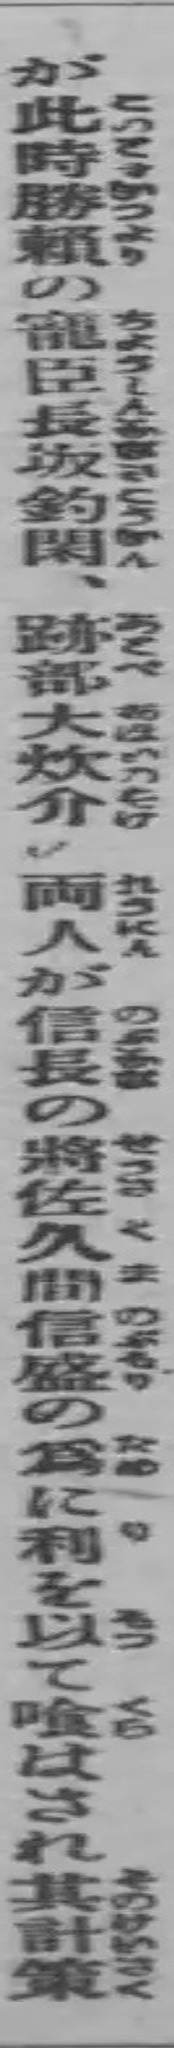が此時勝頼の寵臣長坂釣閑、跡部大炊介の両人が信長の将佐久間信盛の為に利を以て喰はされ其計策
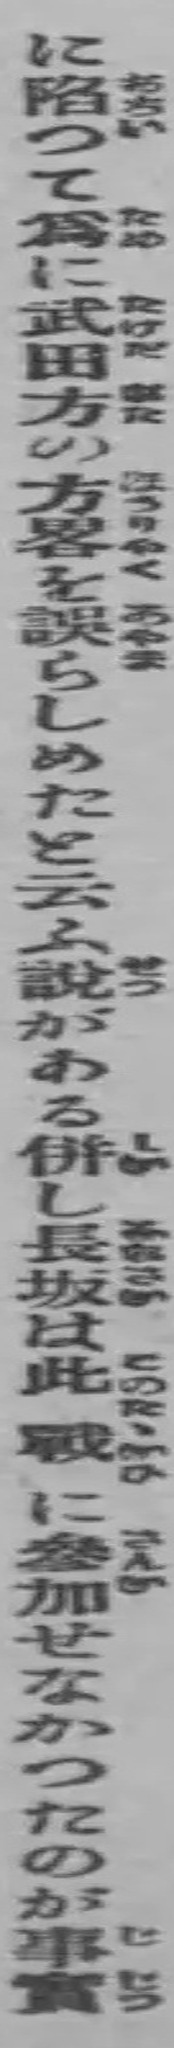に陥つて為に武田方の方略を誤らしめたと云ふ説がある併し長坂は此戦に参加せなかつたのが事実
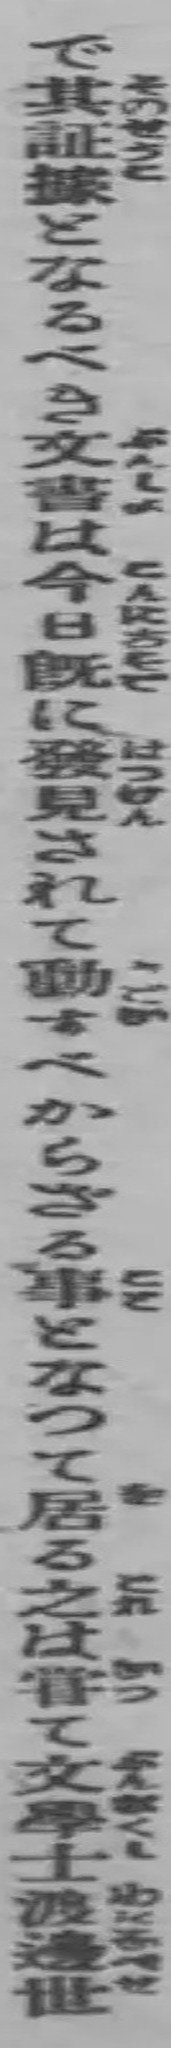で其証拠となるべき文書は今日既に発見されて動すべからざる事となつて居る之は嘗て文学士渡邊世
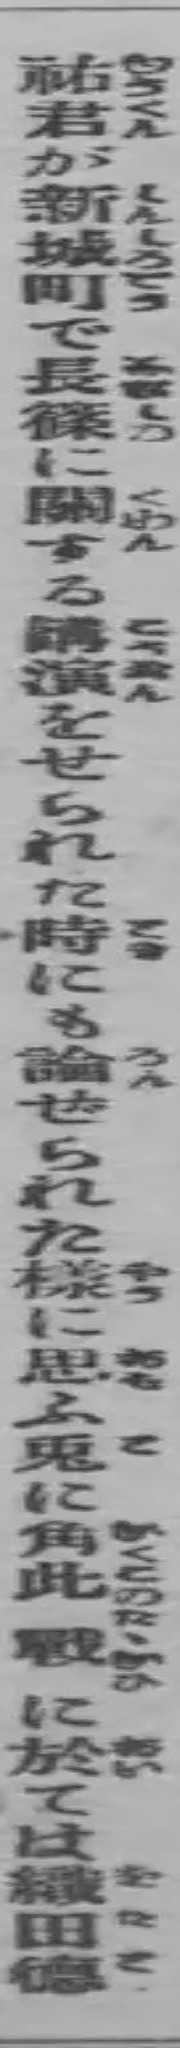祐君が新城町で長篠に関する講演をせられた時にも論ぜられた様に思ふ兎に角此戦に於ては織田徳
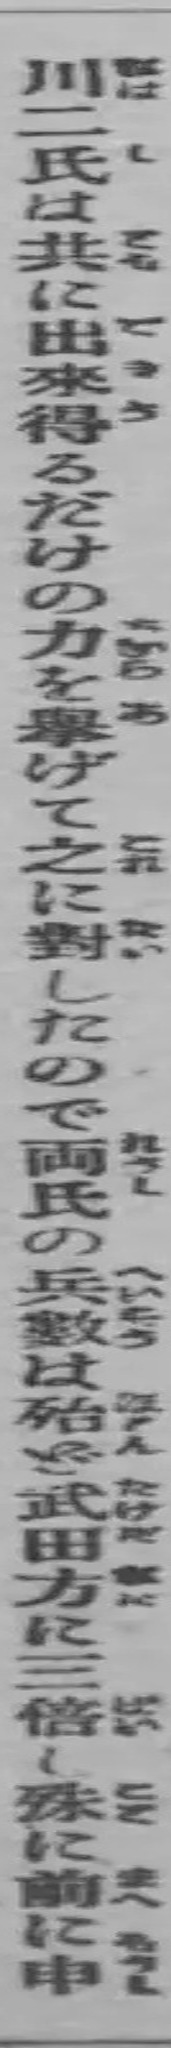川二氏は共に出来得るだけの力を挙げて之に対したので両氏の兵数は殆ど武田方に三倍し殊に前に申
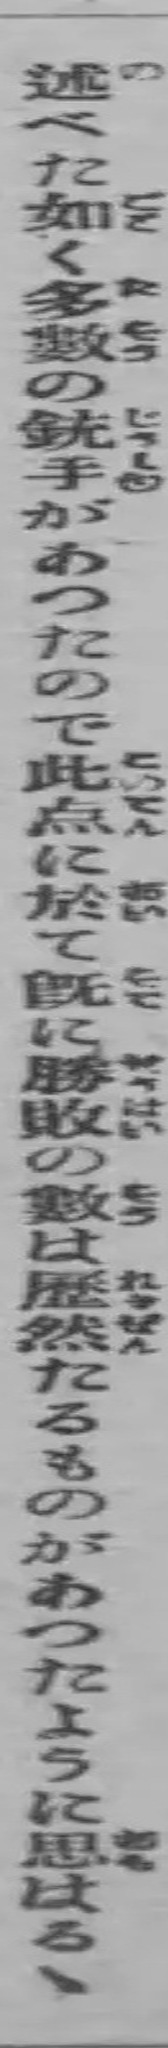述べた如く多数の銃手があつたので此点に於て既に勝敗の数は歴然たるものがあつたように思はるゝ
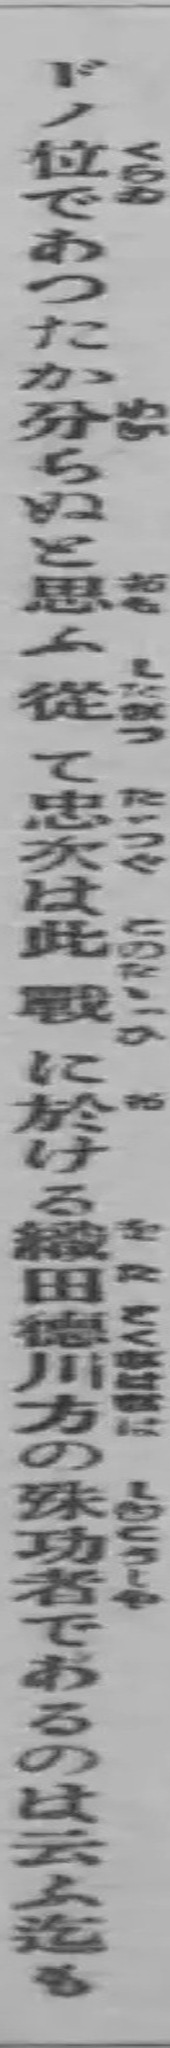ドノ位であつたか分らぬと思ふ従て忠次は此戦に於る織田徳川方の殊功者であるのは云ふ迄も
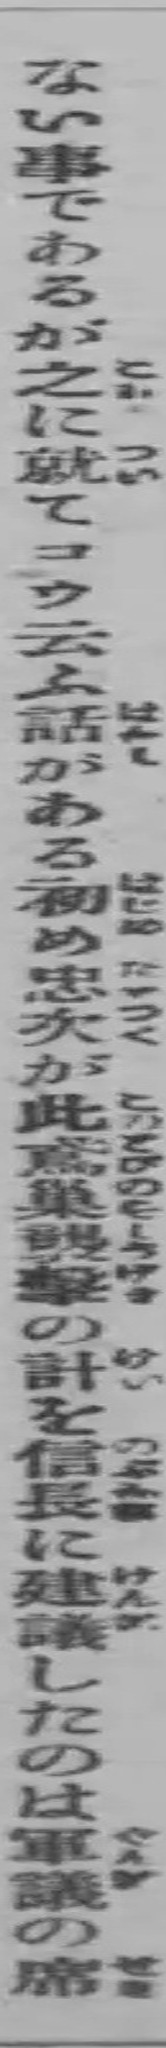ない事であるが之に就てコウ云ふ話がある初め忠次が此鳶巣襲撃の計を信長に建議したのは軍議の席
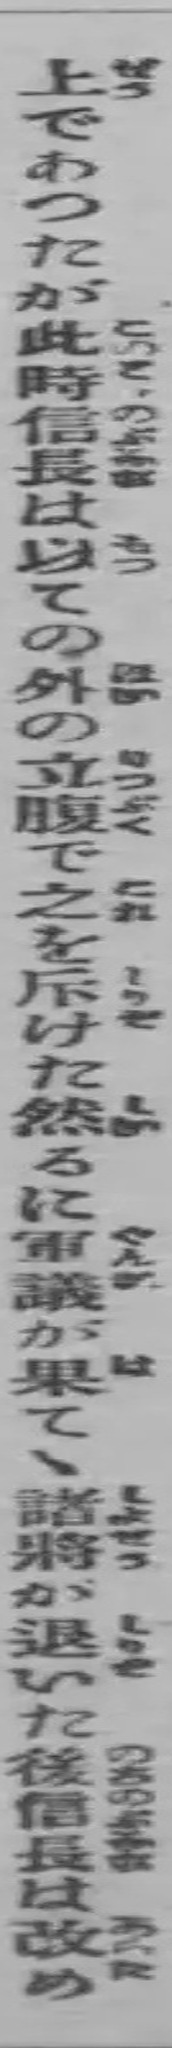上であつたが此時信長は以ての外の立腹で之を斥けた然るに軍議が果てゝ諸将が退いた後信長は改め
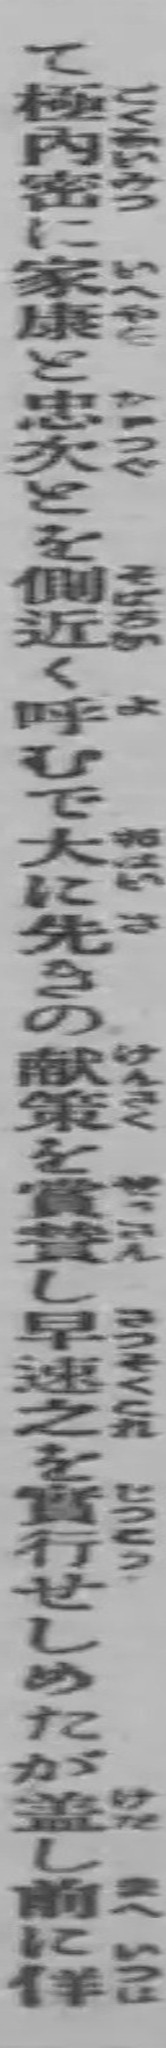て極内密に家康と忠次とを側近く呼むで大に先きの献策を賞賛し早速之を実行せしめたが蓋し前に佯
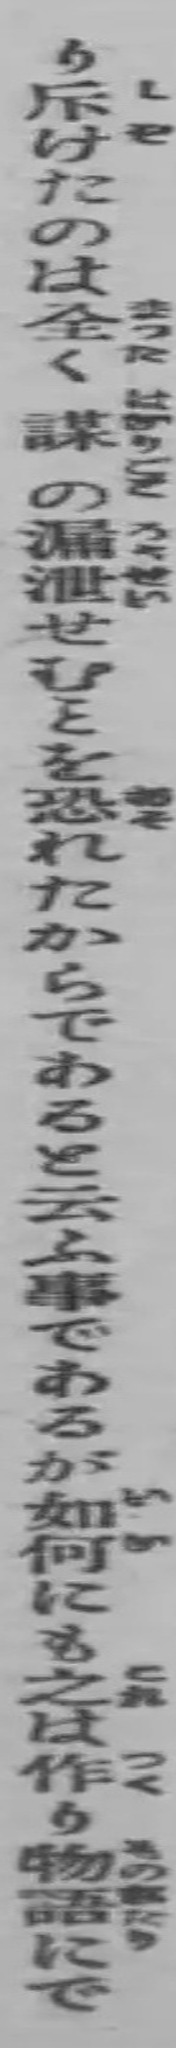り斥けたのは全く謀の漏泄せむことを恐れたからであると云ふ事であるが如何にも之は作り物語にで
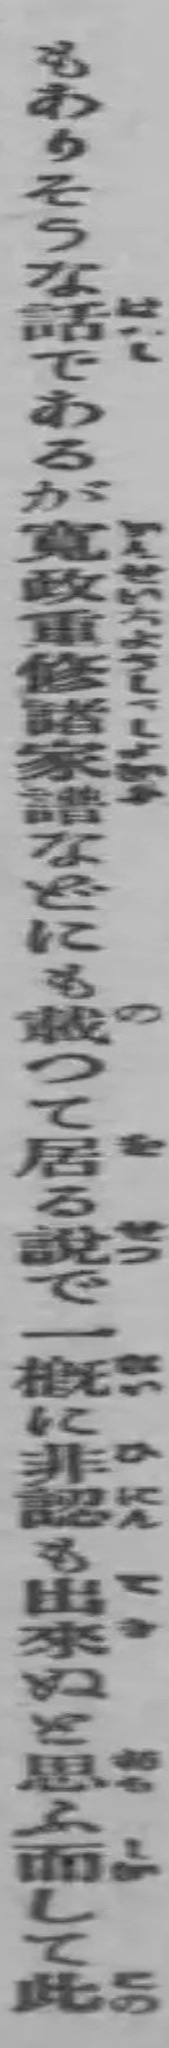もありそうな話であるが寛政重修諸家譜などにも載つて居る説で一概に非認も出来ぬと思ふ而して此
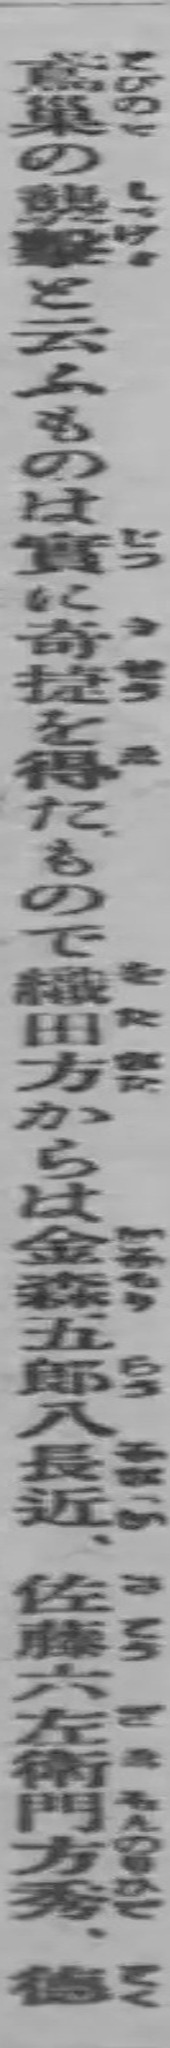鳶巣の襲撃と云ふものは実に奇捷を得たもので織田方からは金森五郎八長近、佐藤六左衛門方秀、徳
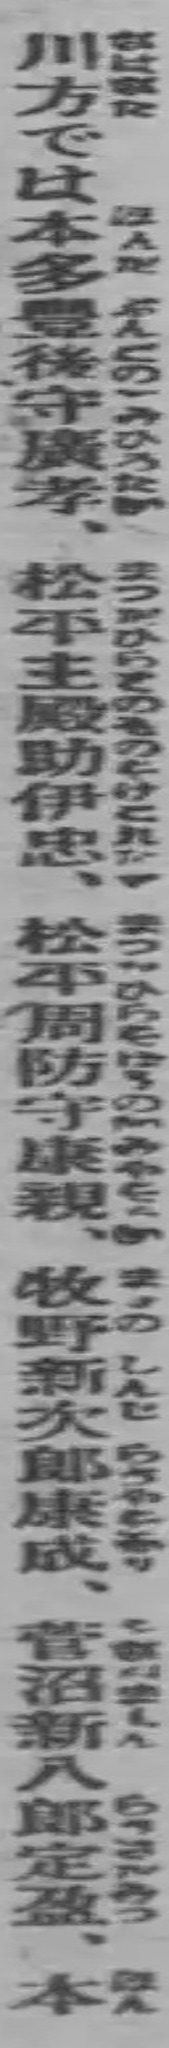川方では本多豊後守広孝、松平主殿助伊忠、松平周防守康親、牧野新次郎康成、菅沼新八郎定盈、本
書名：豊橋市史談
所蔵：国立国会図書館 National Diet Library, JAPAN
